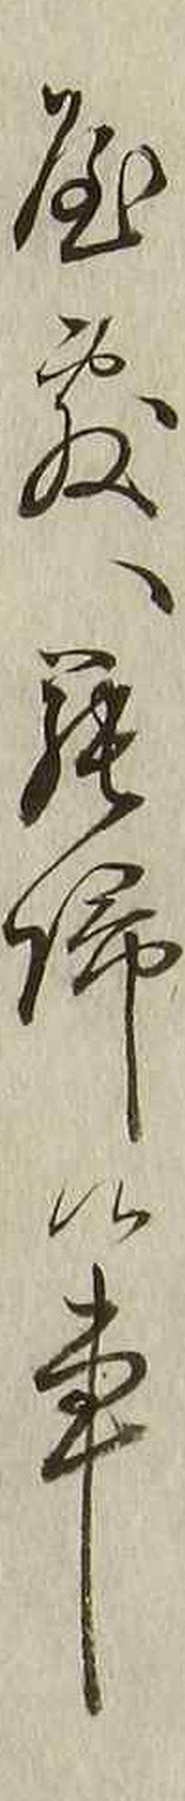屋敷へ罷帰候事
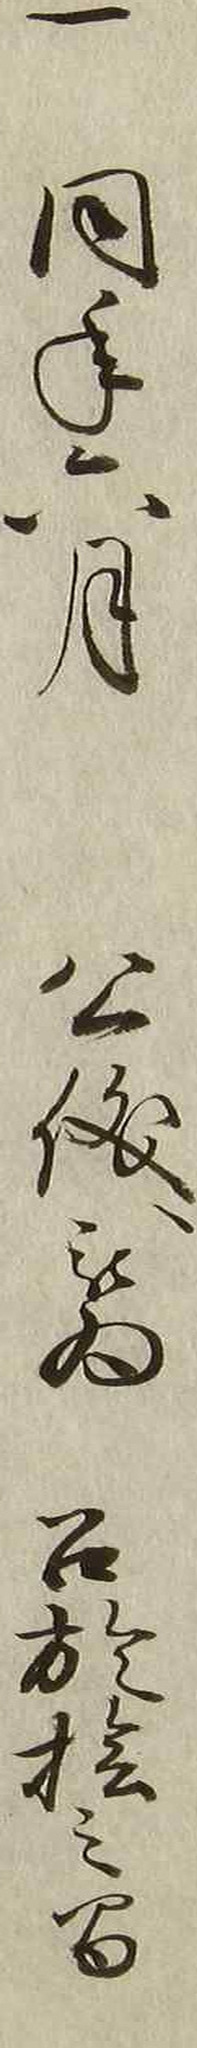一同年六月公儀へ被為召於桧之間
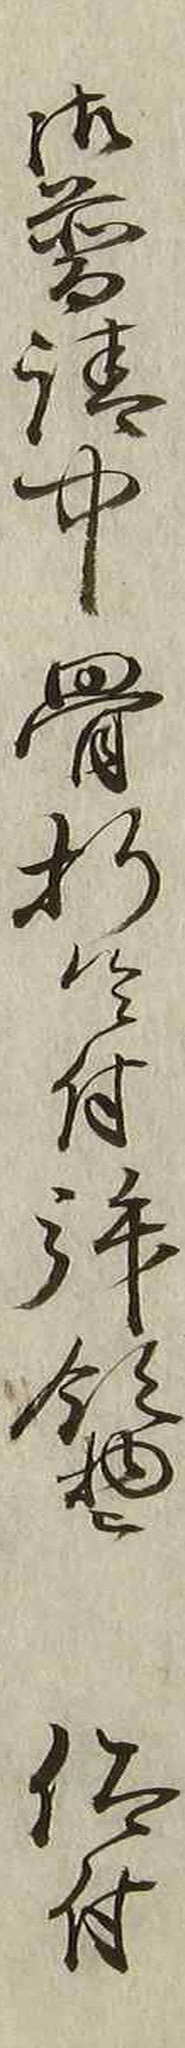御普請中骨折候ニ付拝領物被仰付
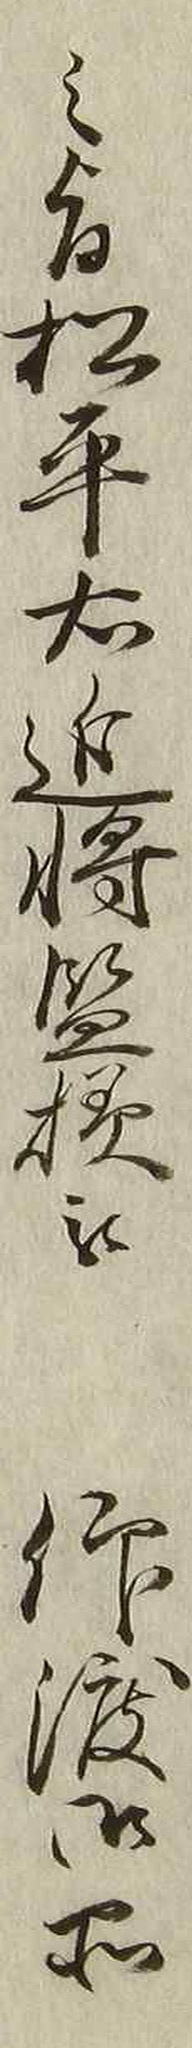之旨松平右近将監様被仰渡御品
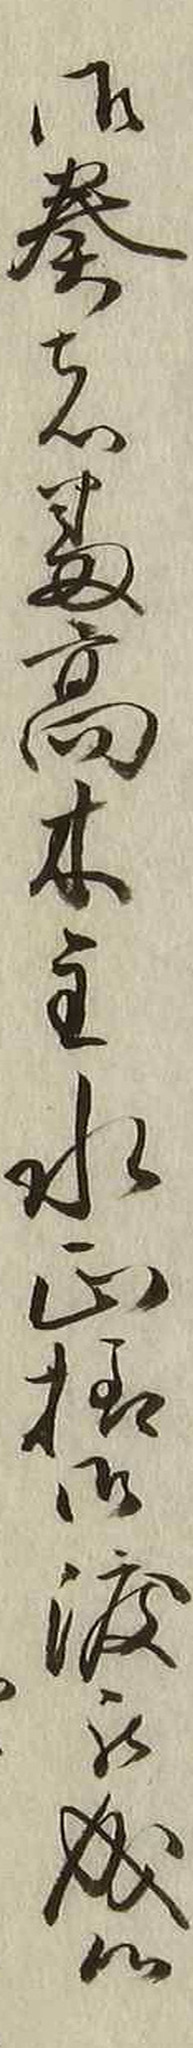御奏者番高木主水正様御渡被成候
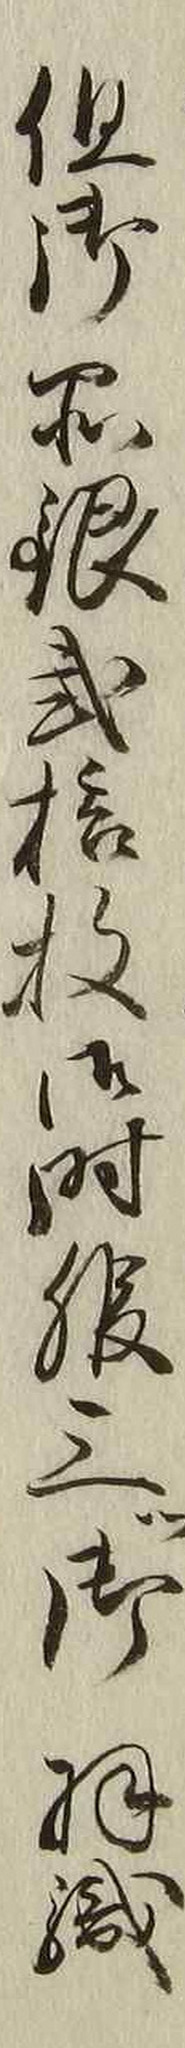但御品銀弐拾枚御時服三ツ御羽織
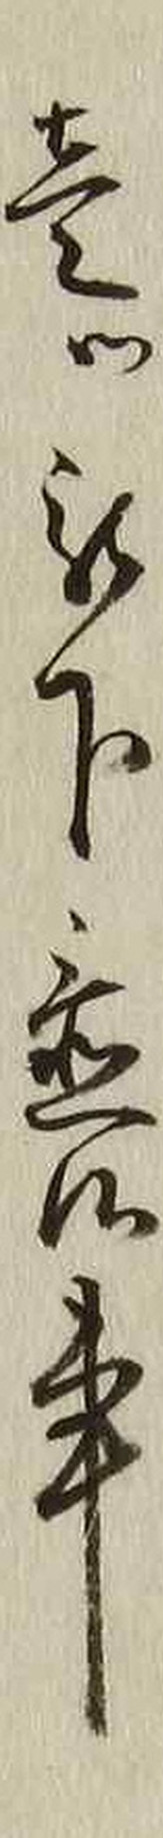壱ツ被下置候事
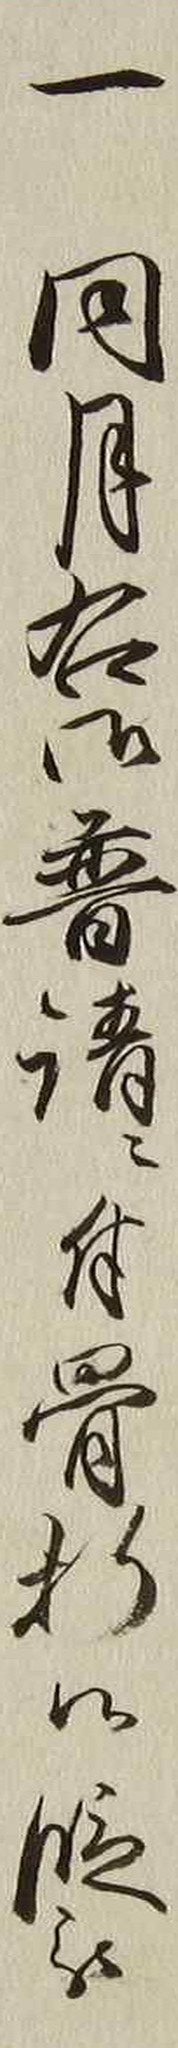一同月右御普請ニ付骨折候段被
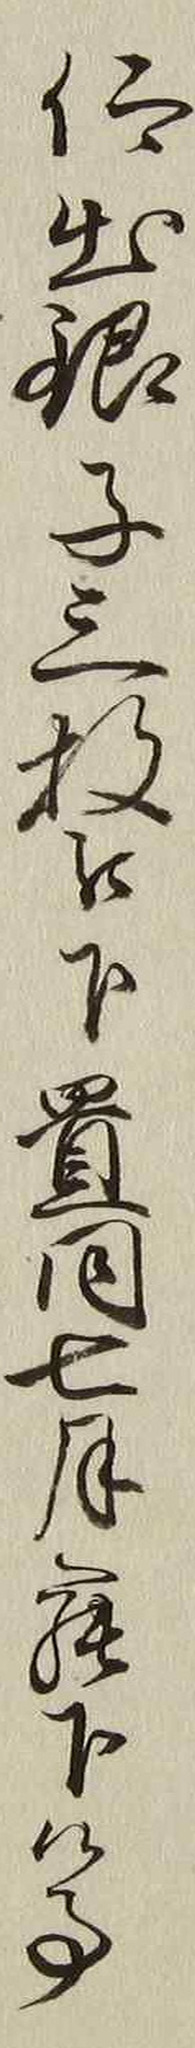仰出銀子三枚被下置同七月罷下候事
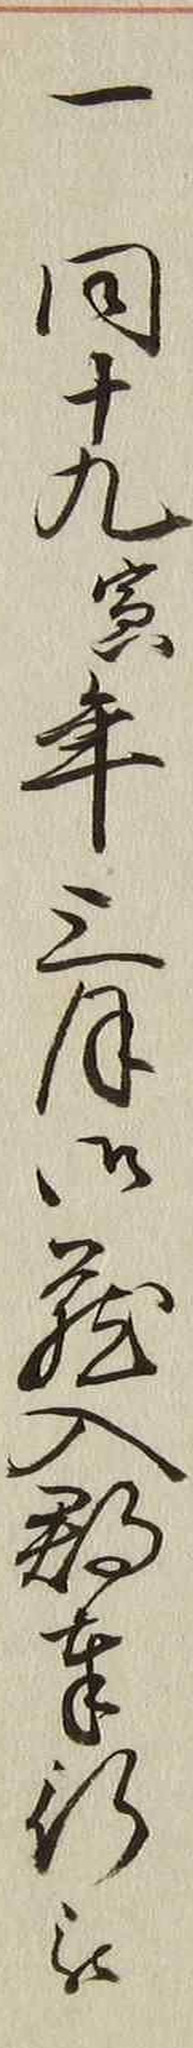一同十九寅年三月御蔵入郡奉行被
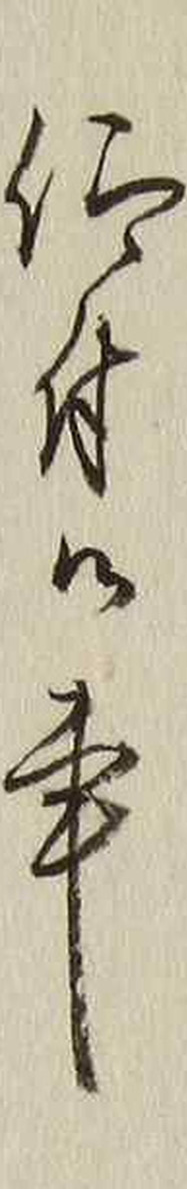仰付候事
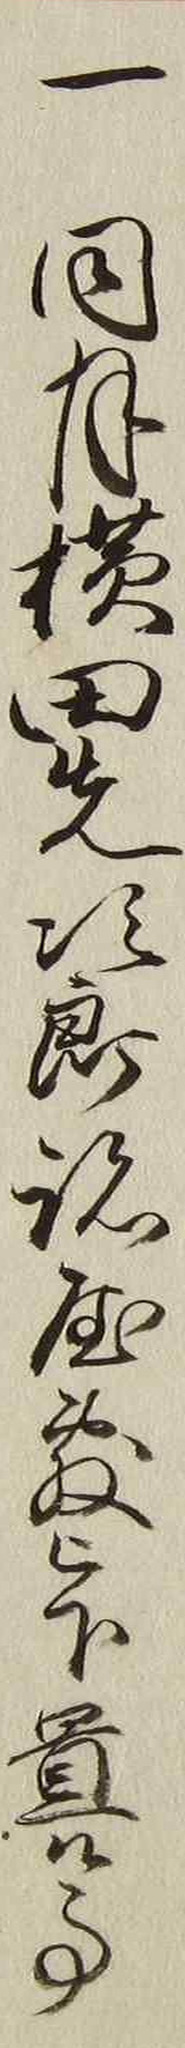一同月横田先次郎跡屋敷被下置候事
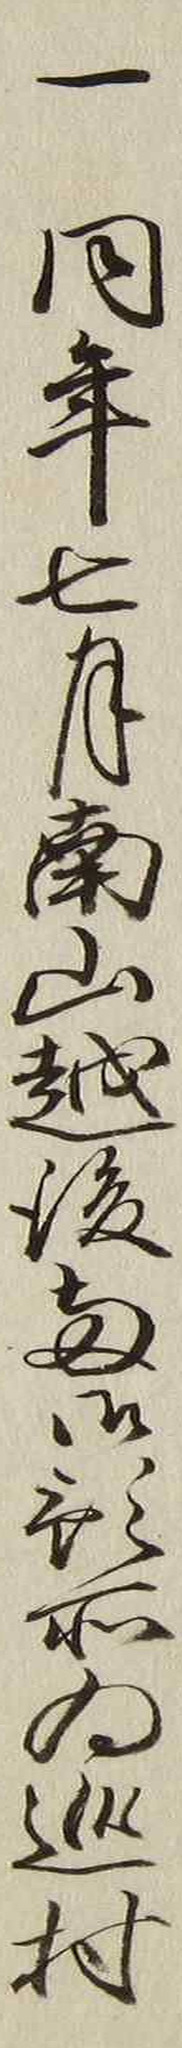一同年七月南山越後両御領所為巡村
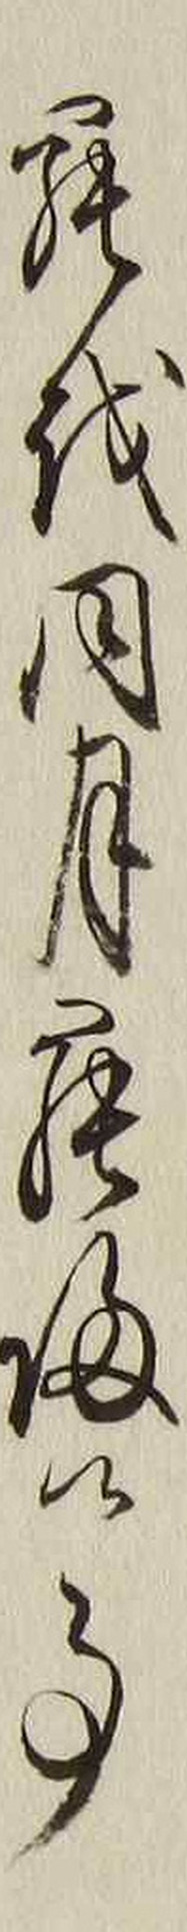罷越同月罷帰候事
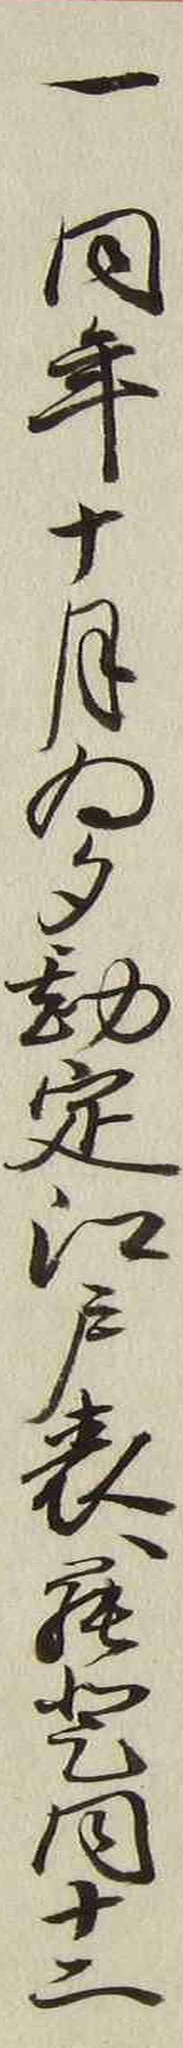一同年十月為御勘定江戸表へ罷登同十二
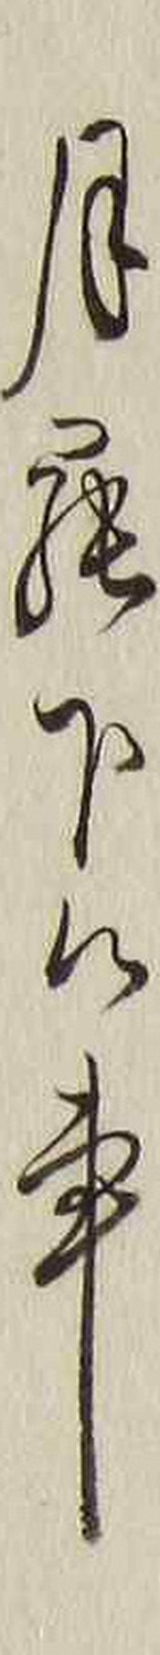月罷下候事
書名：諸士系譜　巻之21　い之部21
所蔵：会津若松市立会津図書館
